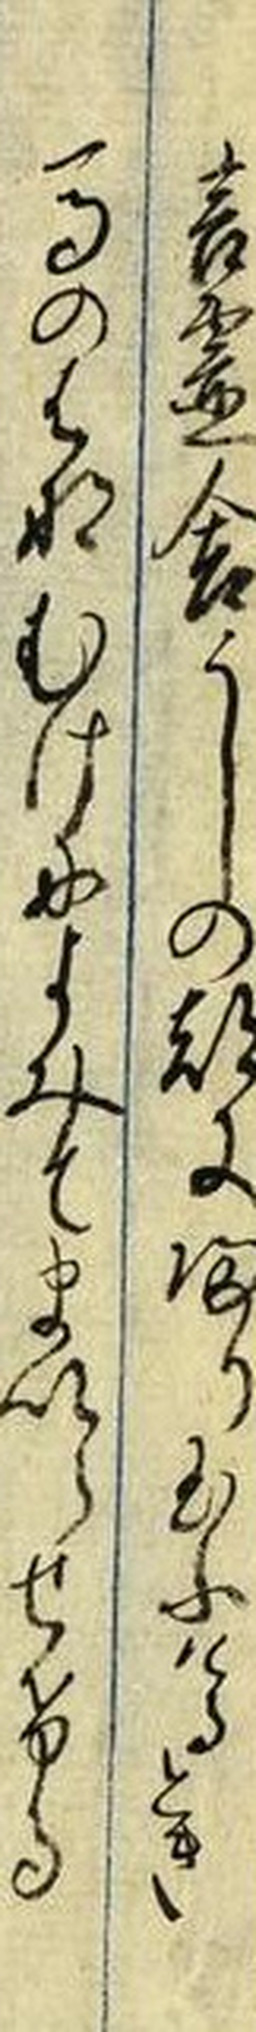馬のはなむけによみてまいらせける
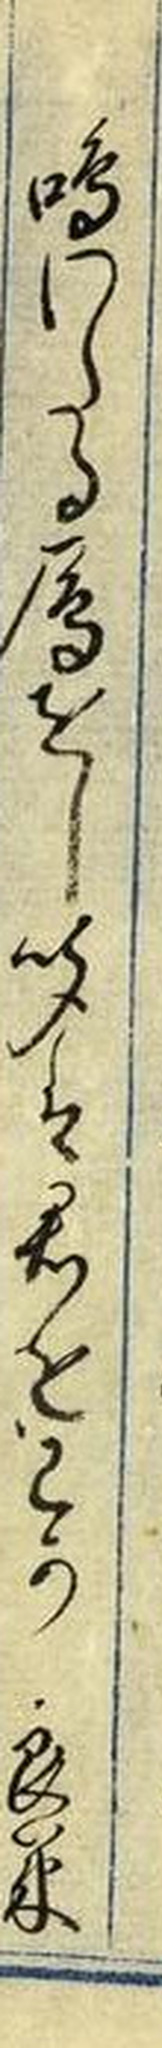鳴わたる鳫をし聞は君をわか良策
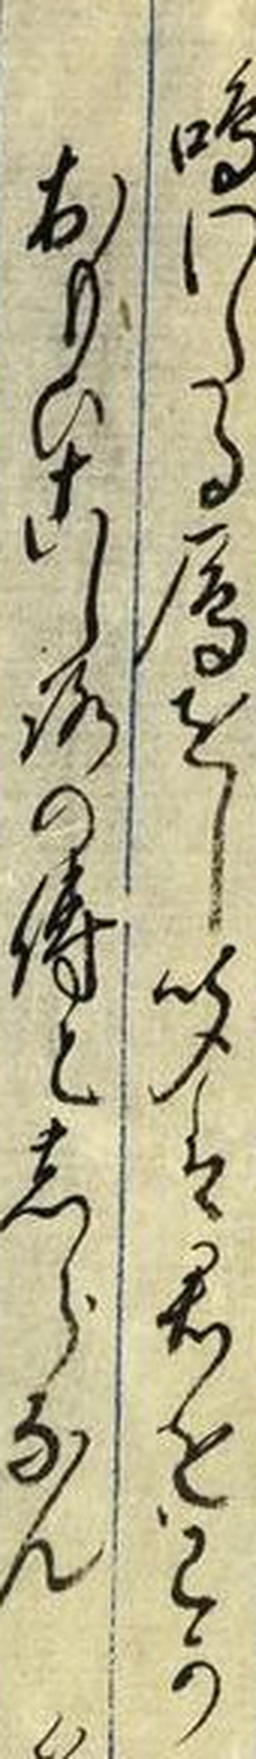おもひこし路の侍としらなん笠原
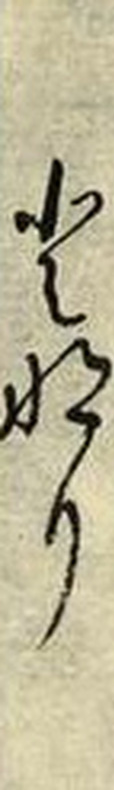となり
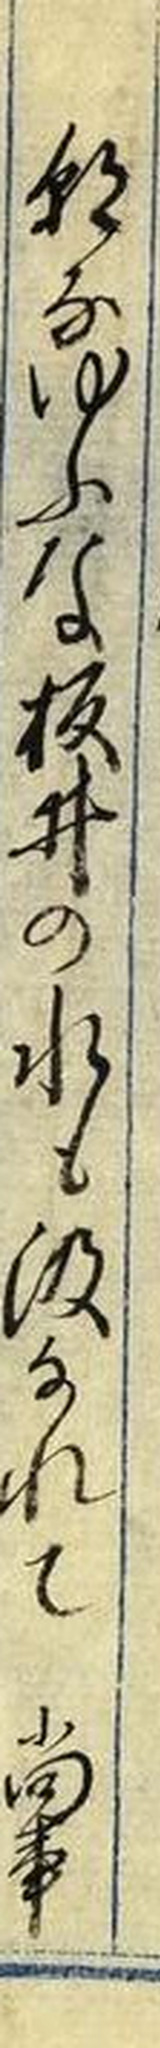朝なゆふな板井の水も汲なれて尚事
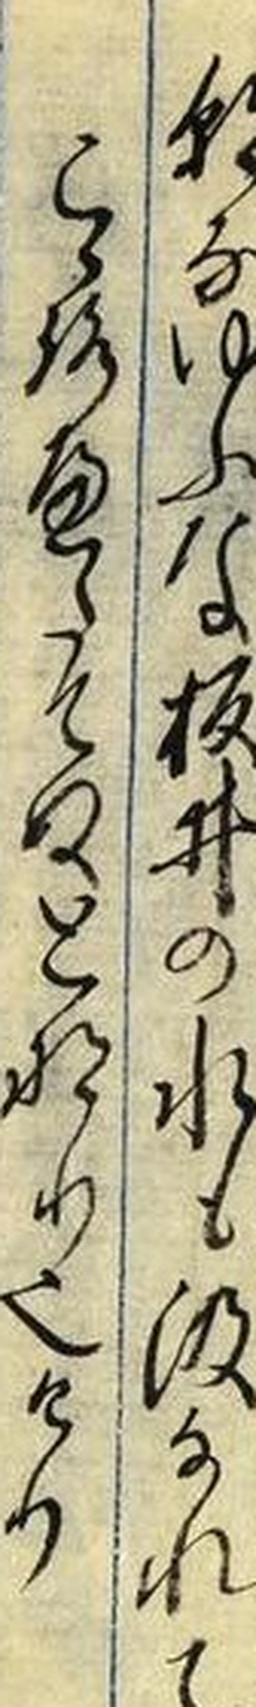こゝろへたてぬとなり也けり
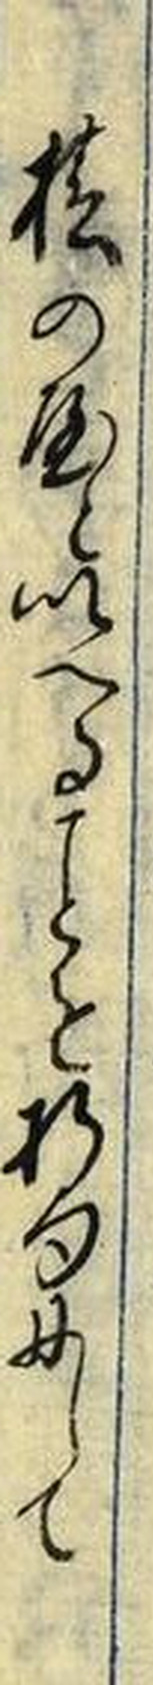椿の屋といへることを折句にして

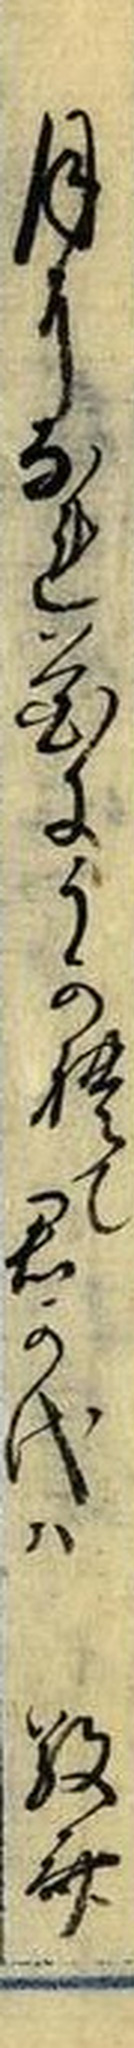月になれ花にうかれて君が代は敬斎
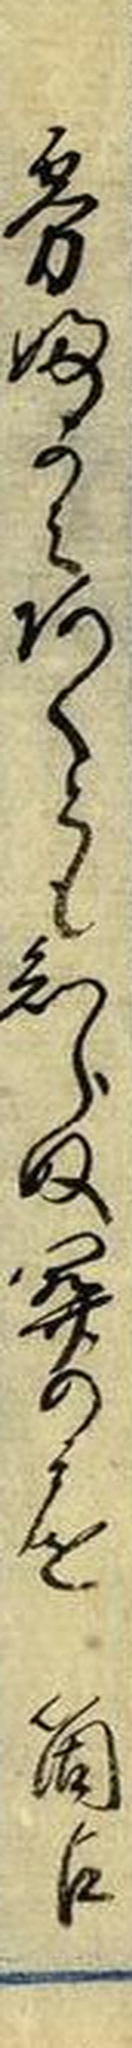雰ふかみあくとも知らぬ関の戸を筒古
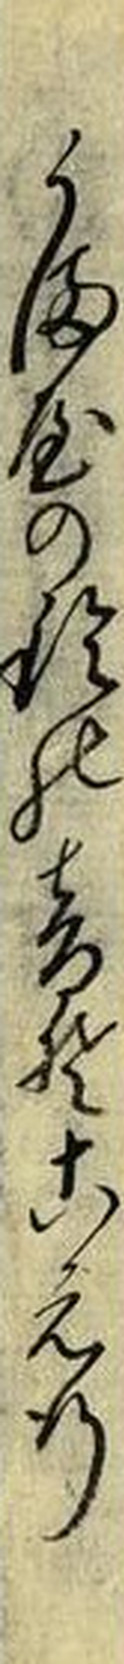うま屋の鈴の音そこえ行
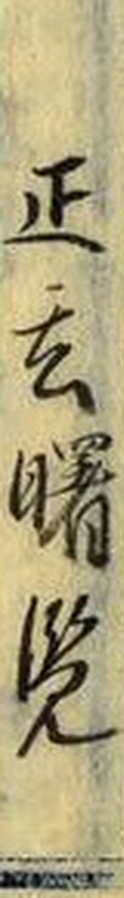正玄曙覧
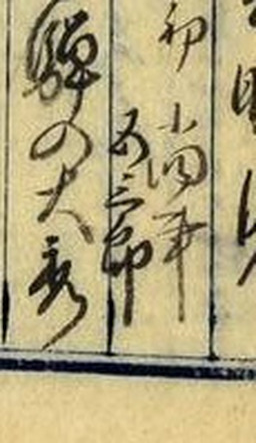五三郎
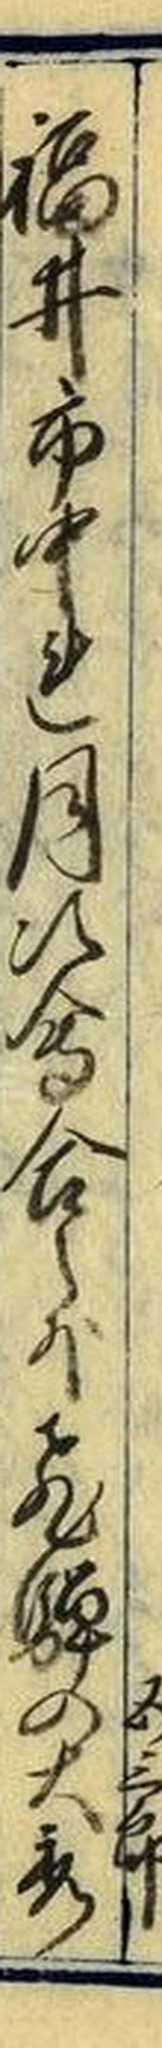福井市中連月次會合之外飛騨の大秀
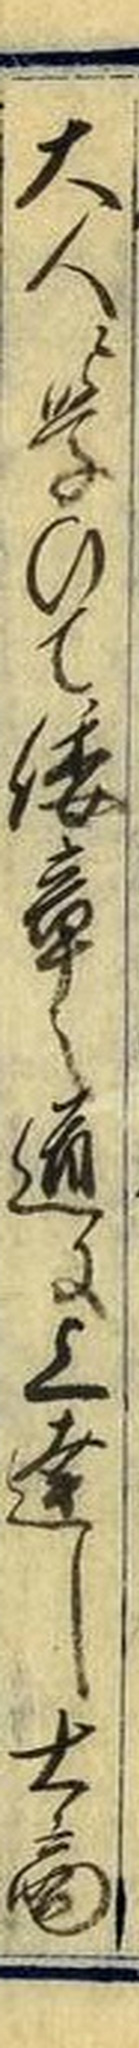大人に学ひて倭章之道に上達し士商
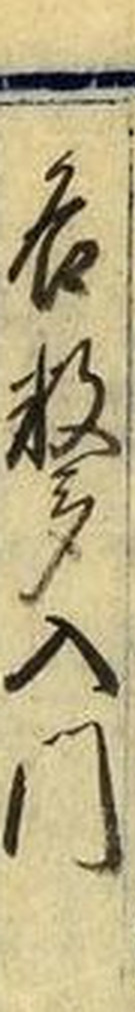各数多入門
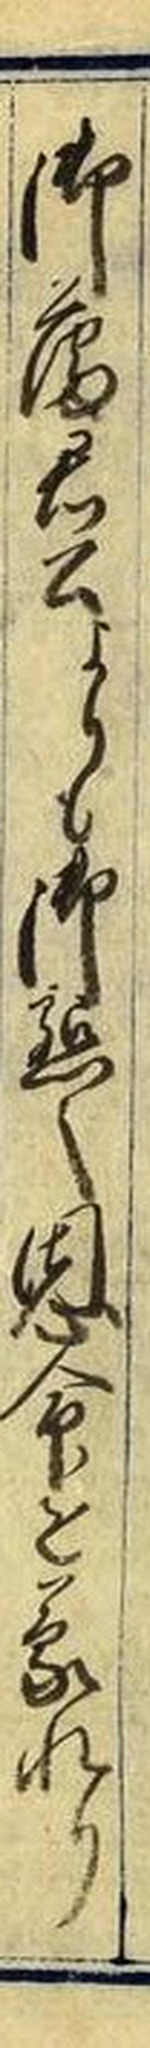御藩君公よりも御懇之恩命を蒙れり
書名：温古集 三巻
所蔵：福井県文書館 Fukui Prefectural Archives
